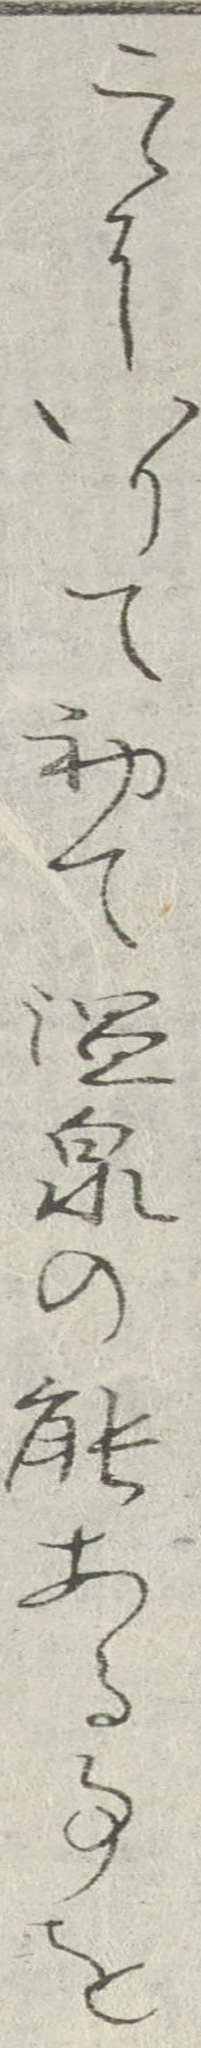こゝにいりて初て温泉の能ある事を
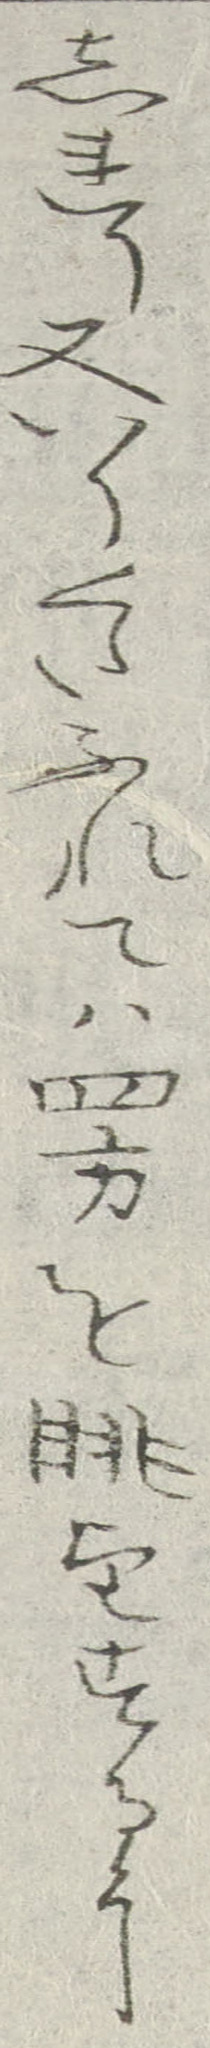しれり又いりくたふれては四方を眺望するに
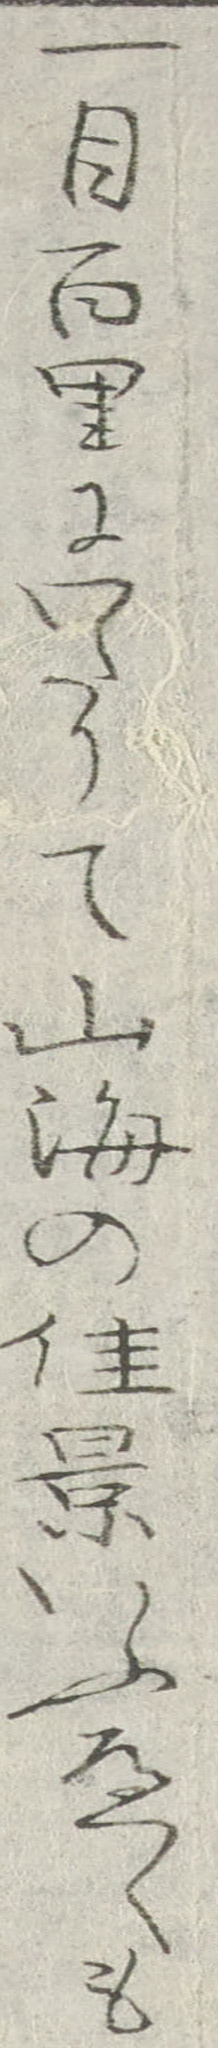一目百里にいたりて山海の佳景いふへくも
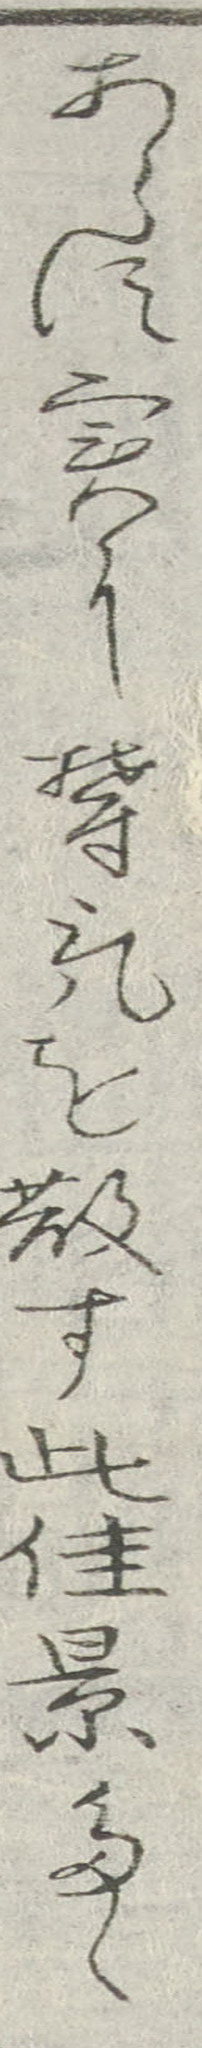あらす実に禁気を散す此佳景多く
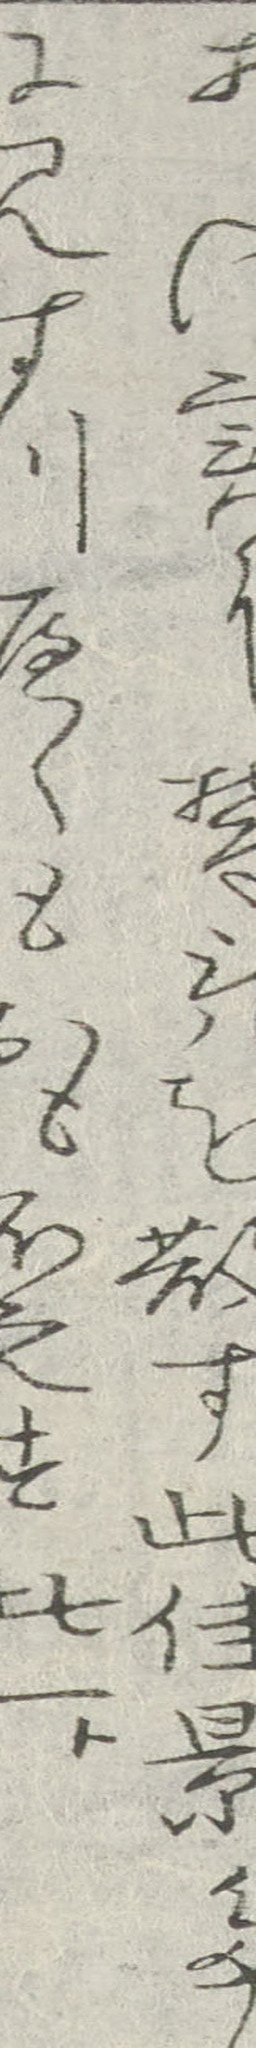に見すつよくもおもほえす此一ト
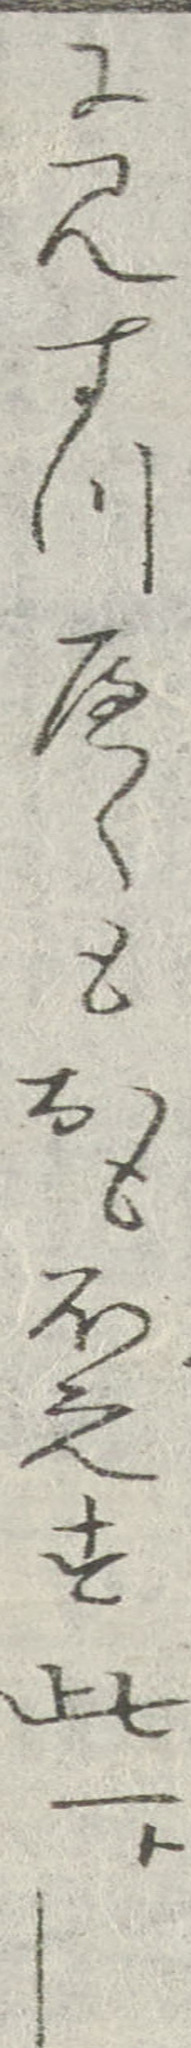に見すつよくもおもほえす此一ト
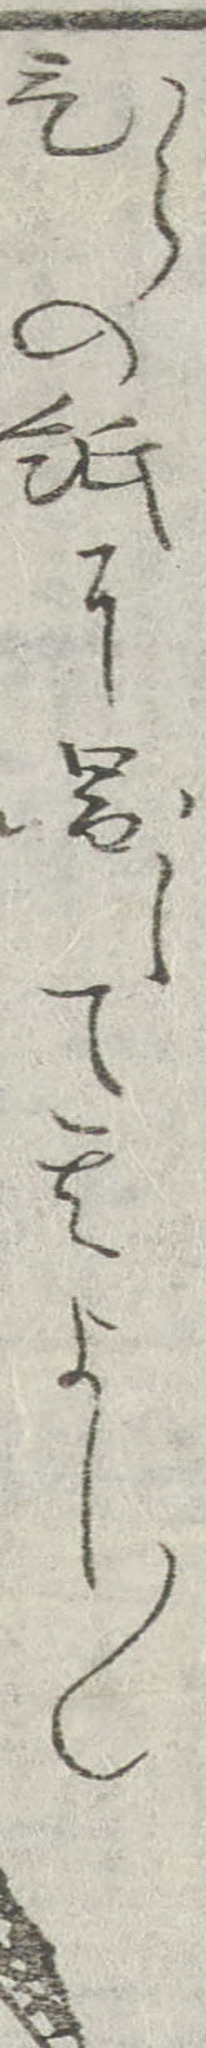しの紙に図して其よし〳〵
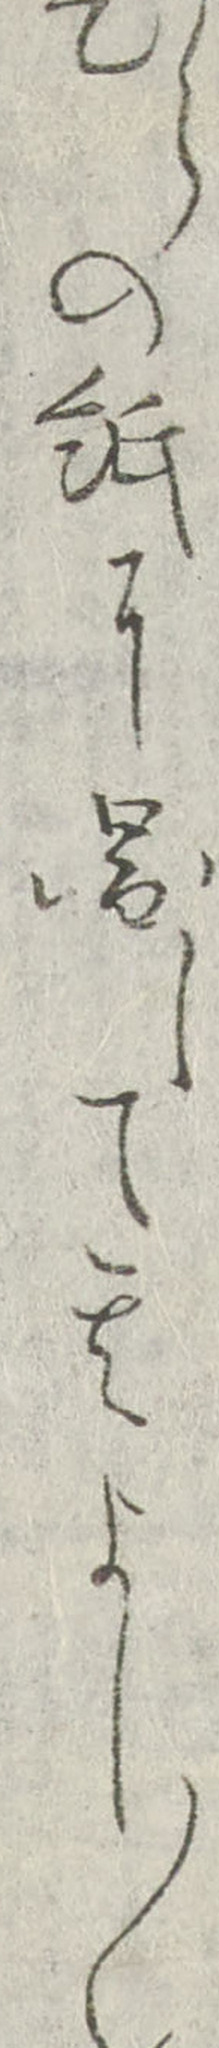しの紙に図して其よし〳〵
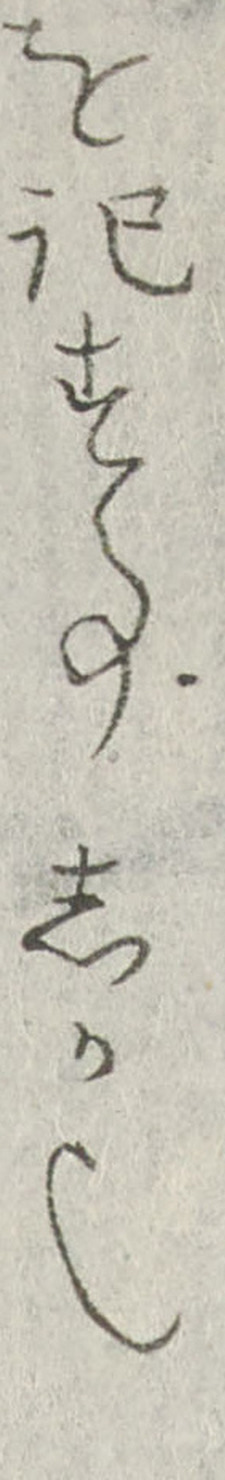を記す事しか〳〵
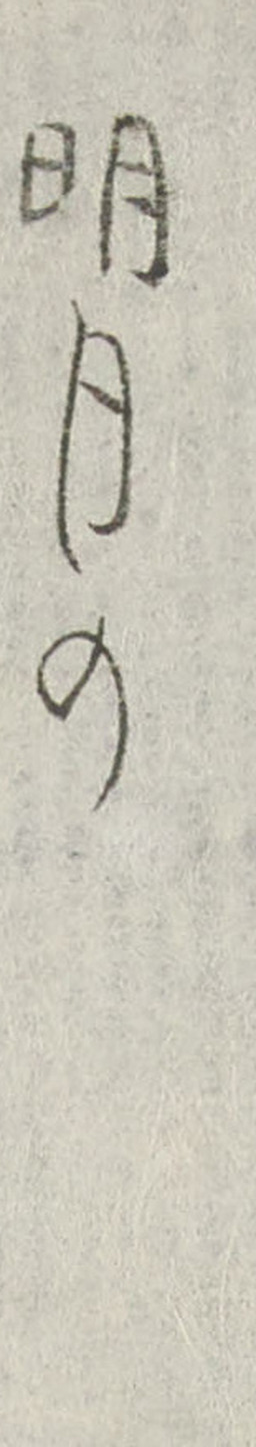明月の
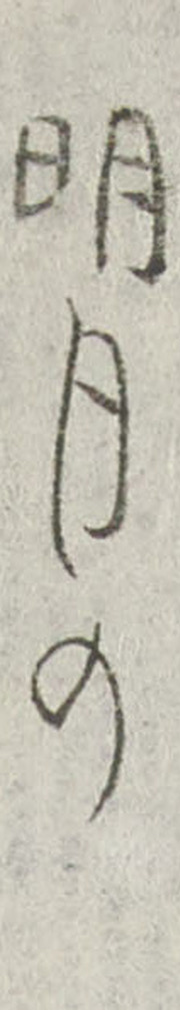明月の
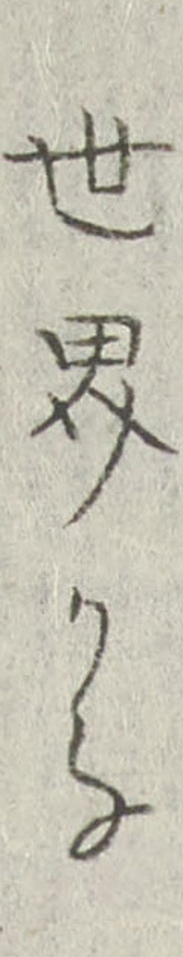世界かな
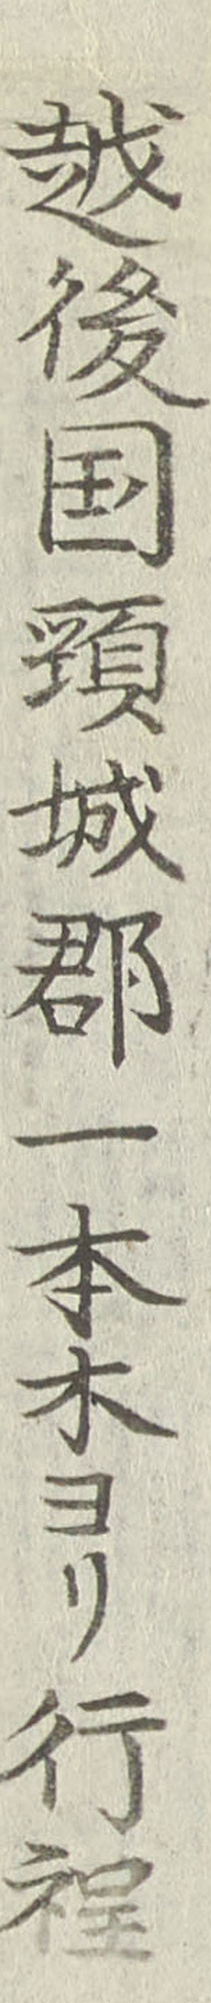越後国頸城郡一本木ヨリ行程
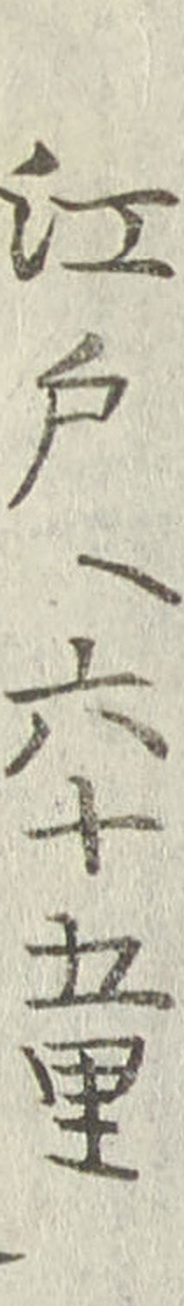江戸ヘ六十五里
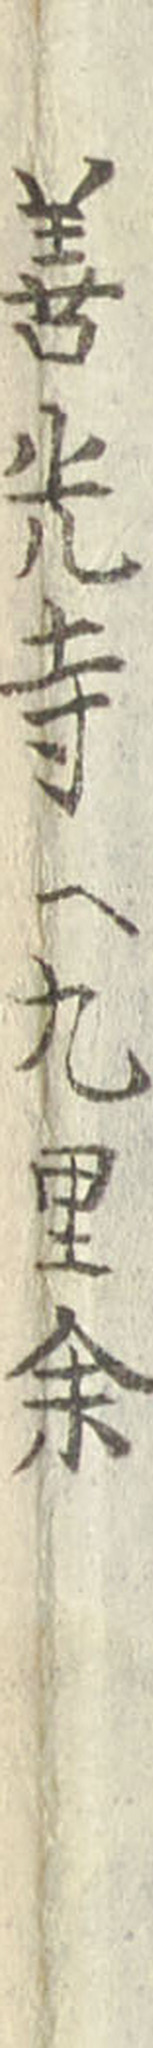善光寺ヘ九里余
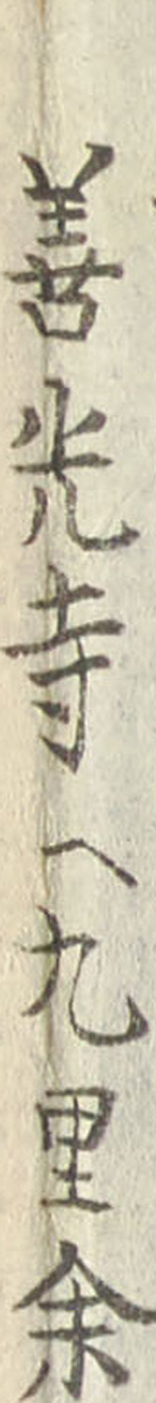善光寺ヘ九里余
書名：一本木温泉之記
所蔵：東京大学総合図書館 General Library in the University of Tokyo, JAPAN
